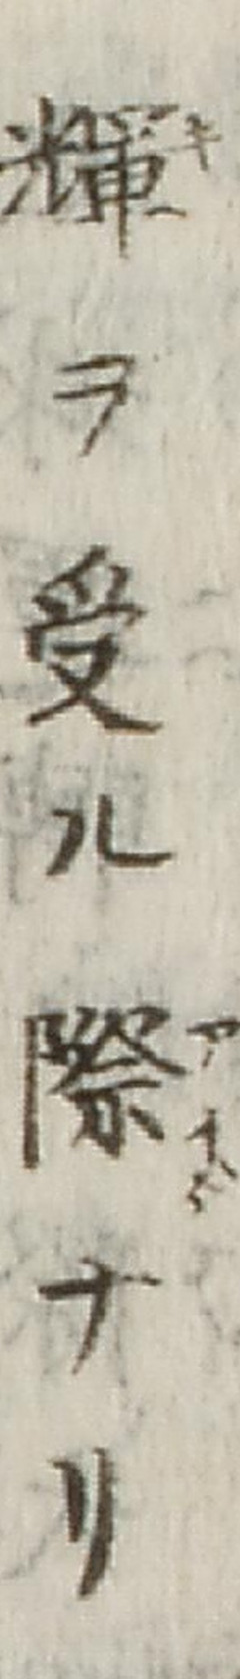輝ヲ受ル際ナリ
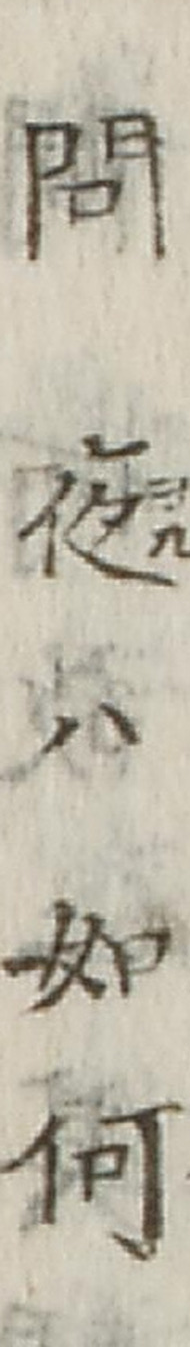問夜ハ如何
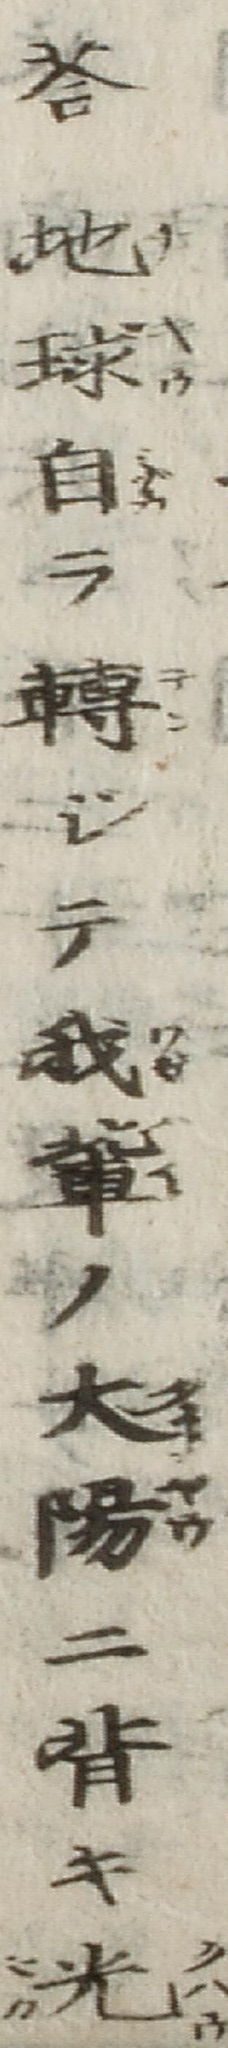答地球自ラ転ジテ吾輩ノ太陽ニ背キ光
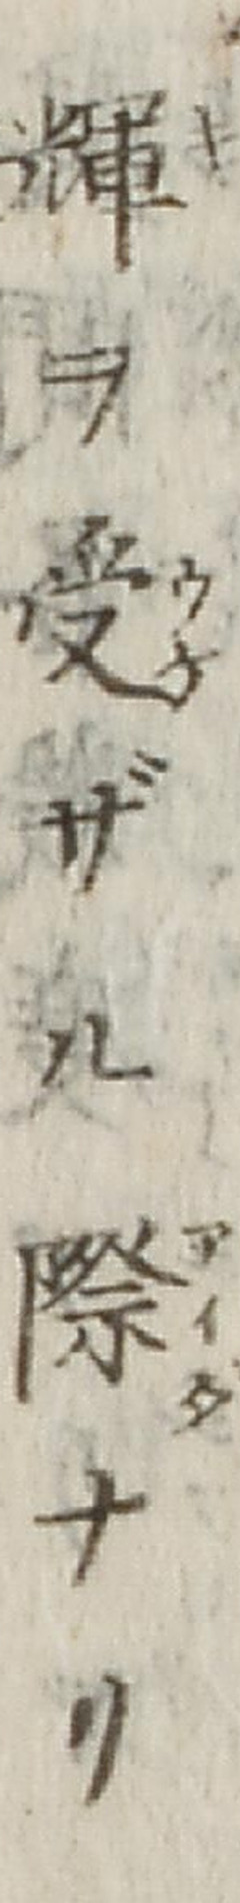輝ヲ受ザル際ナリ
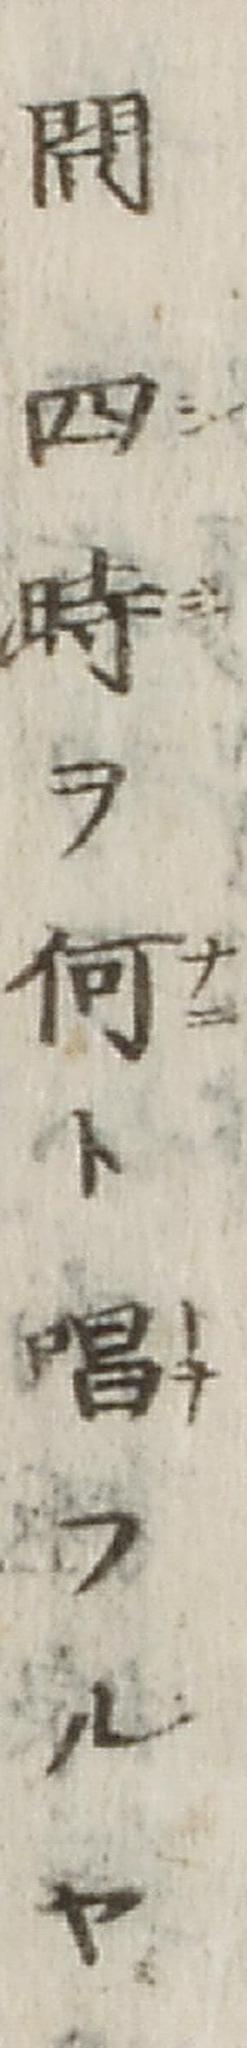問四時ヲ何ト唱フルヤ
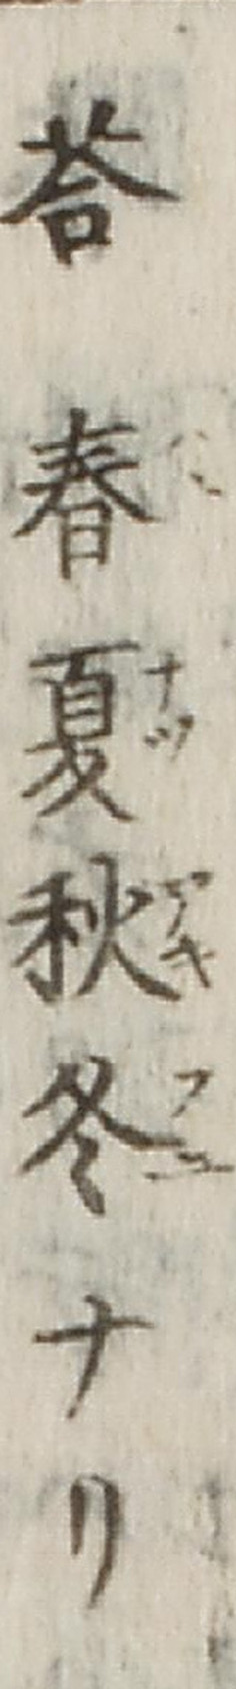答春夏秋冬ナリ
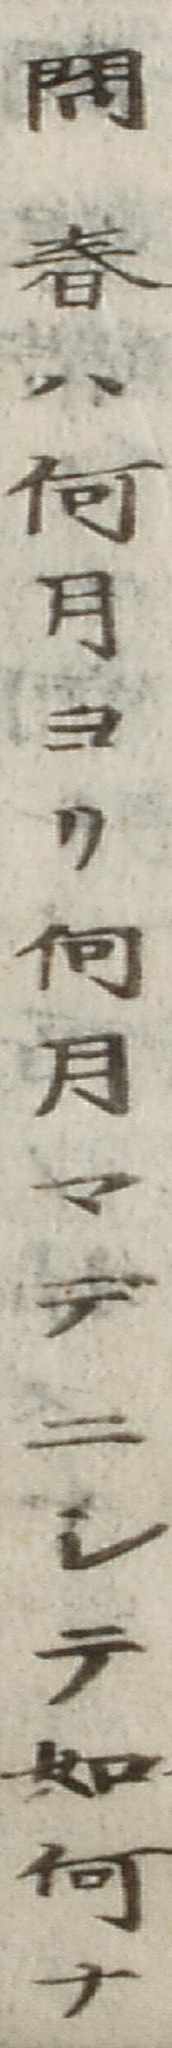問春ハ何月ヨリ何月マデニシテ如何ナ
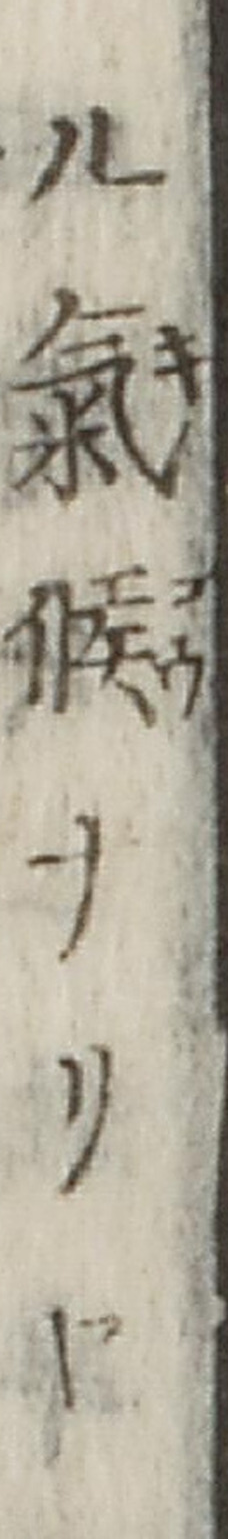ル気候ナリヤ
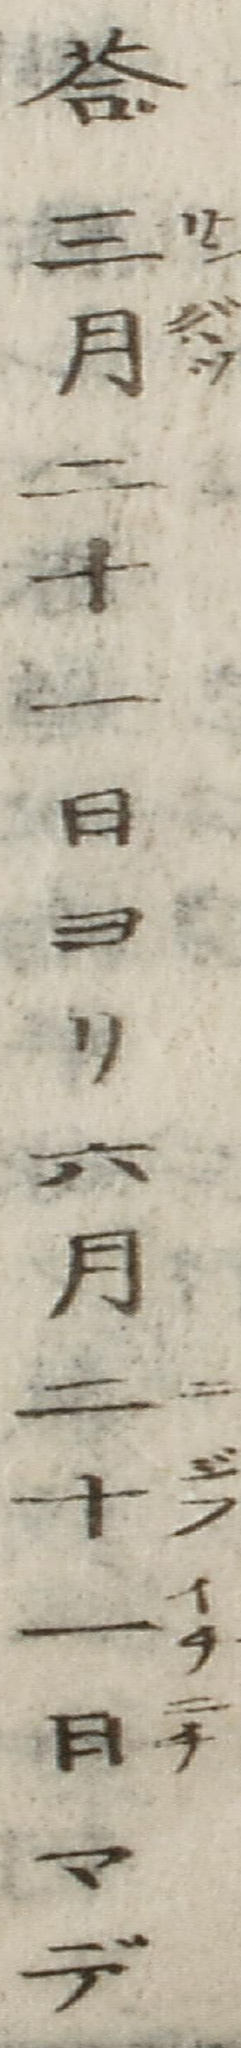答三月二十一日ヨリ六月二十一日マデ
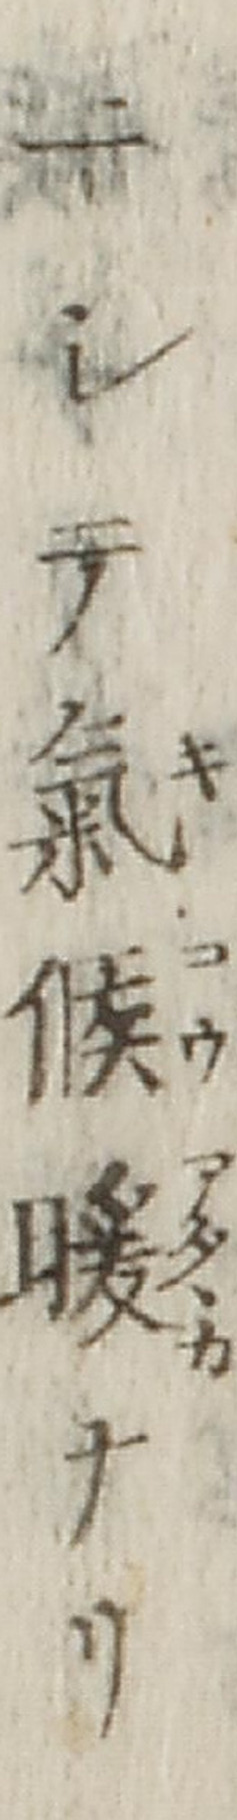ニシテ気候暖ナリ
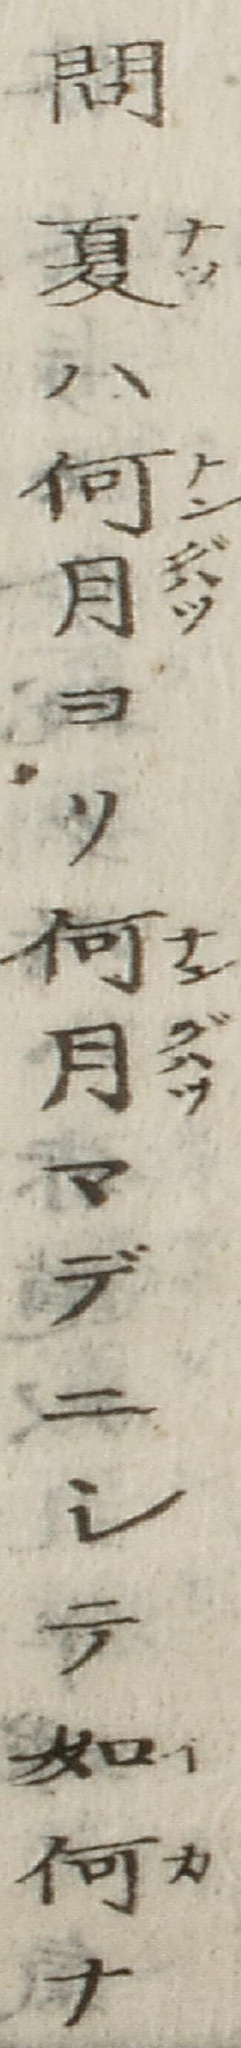問夏ハ何月ヨリ何月マデニシテ如何ナ
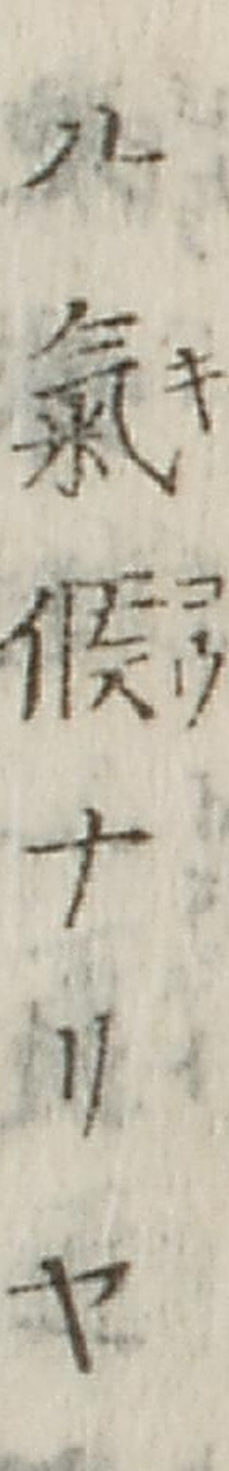ル気候ナリヤ
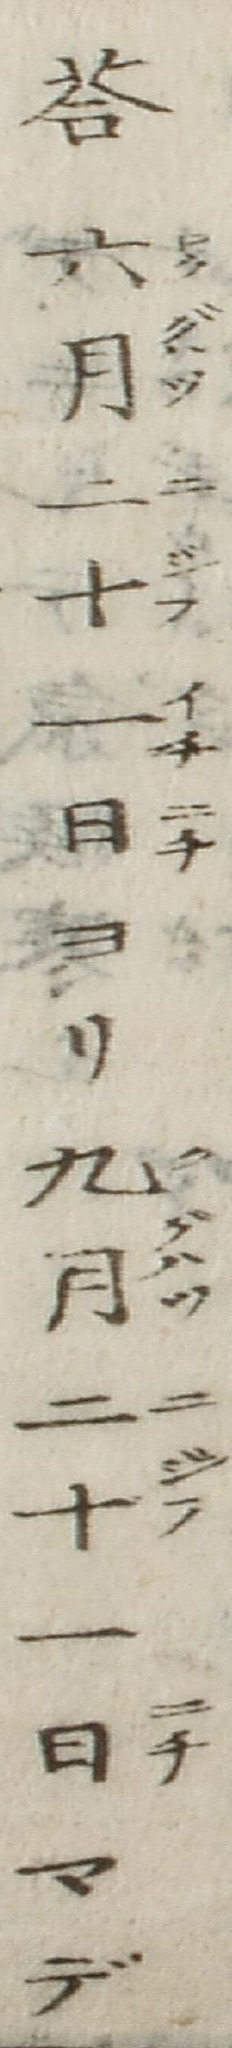答六月二十一日ヨリ九月二十一日マデ
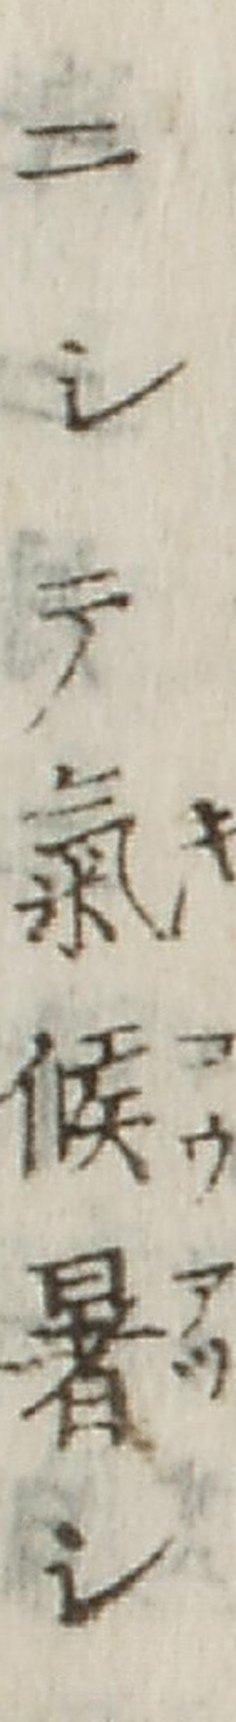ニシテ気候暑シ
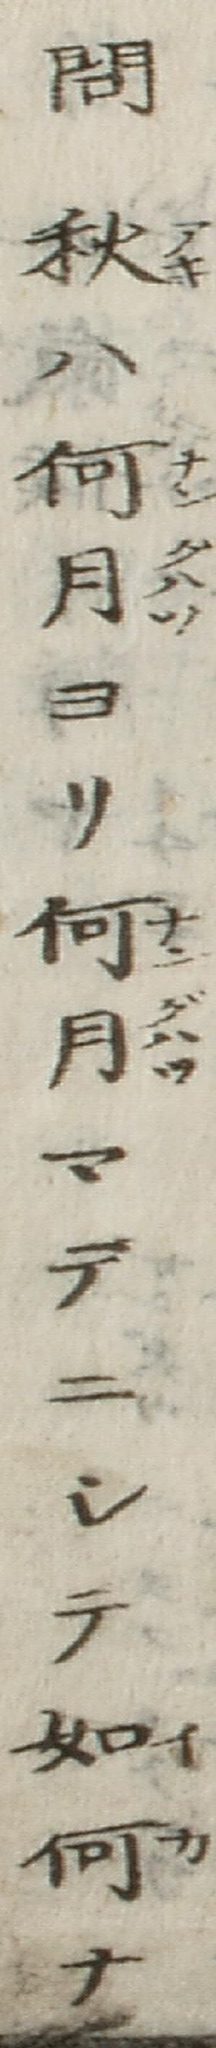問秋ハ何月ヨリ何月マデニシテ如何ナ
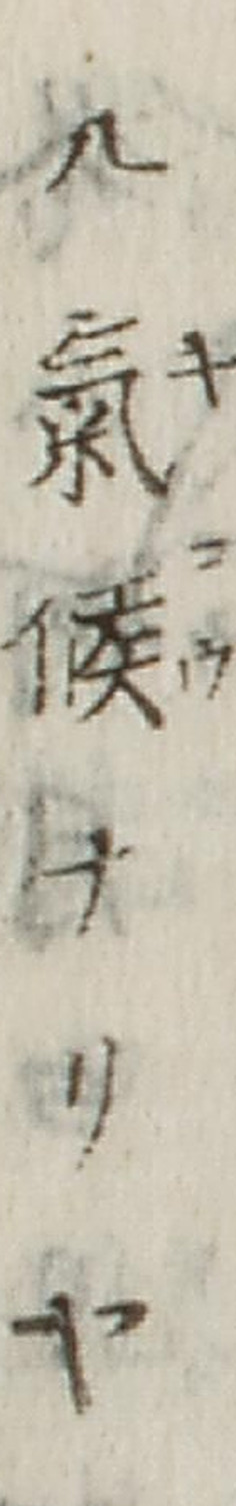ル気候ナリヤ
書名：地球儀問答　全
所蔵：東京大学地震研究所図書室 Earthquake Research Institute Library, The University of Tokyo, JAPAN
